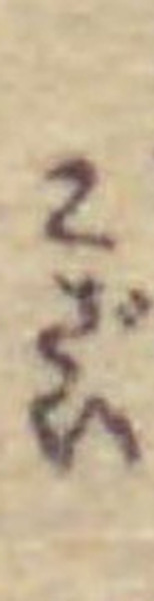こざい
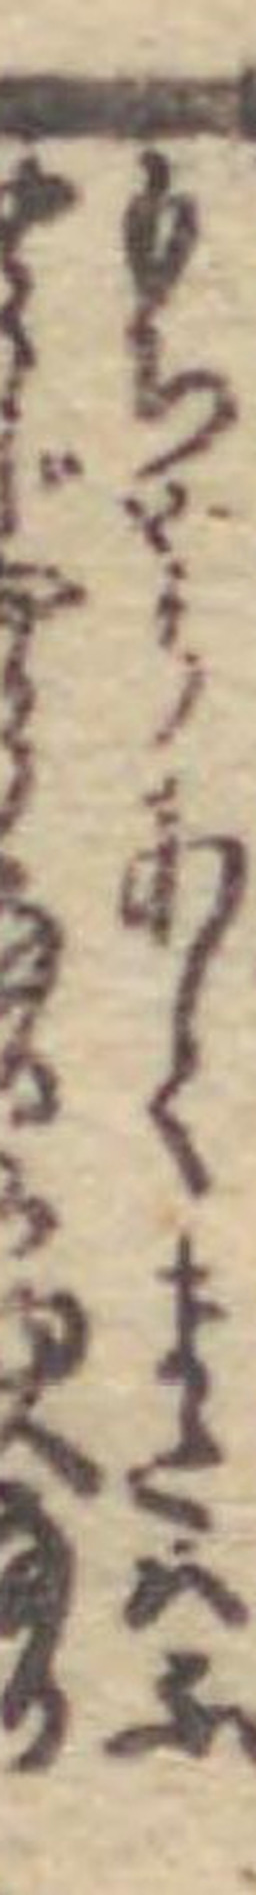やうじやうなるか災なり
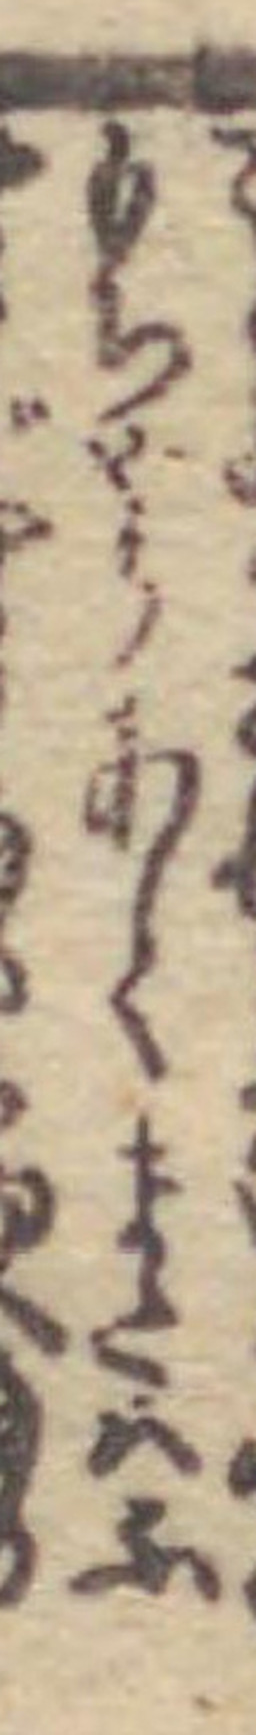もちやうあしくまたはふ
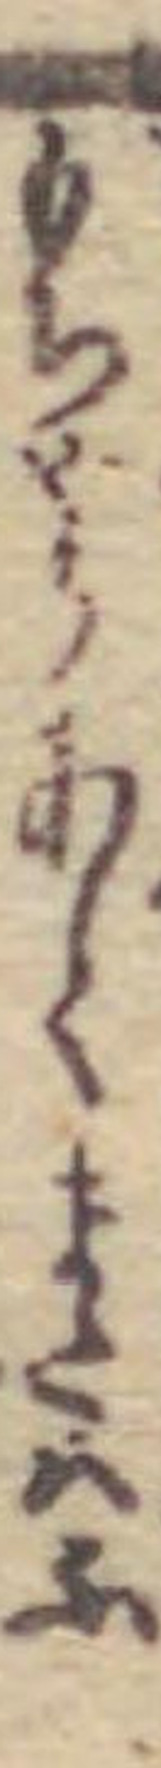もちやうあしくまたはふ
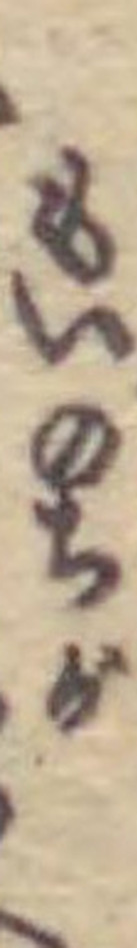もいのちが
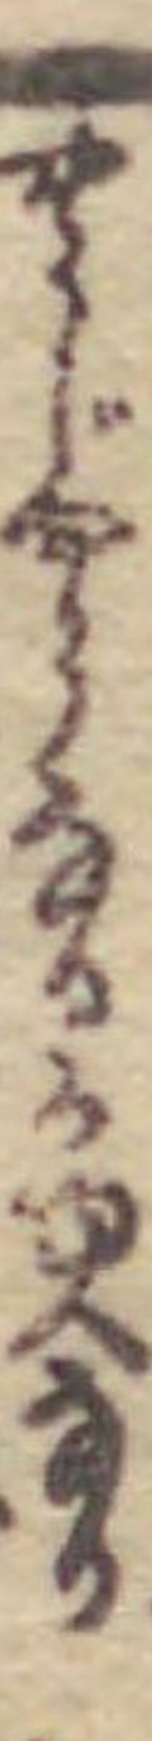やうじやうなるか災なり
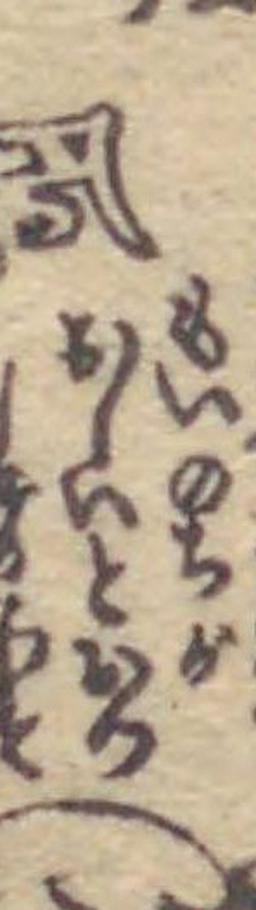おしいとおつ
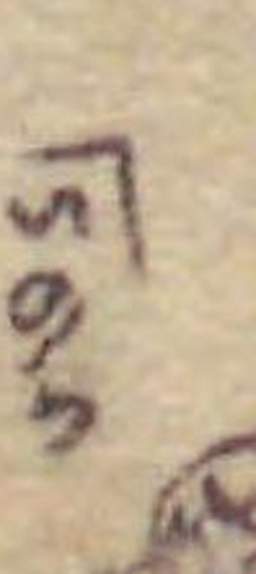〽いのち
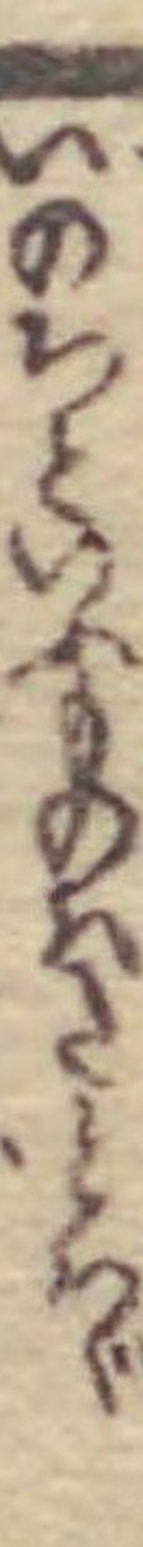いのちといふものはたとはゞ
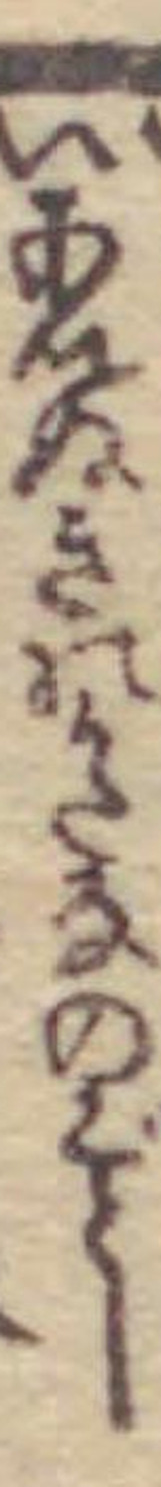いあいぬきのかたなのごとし
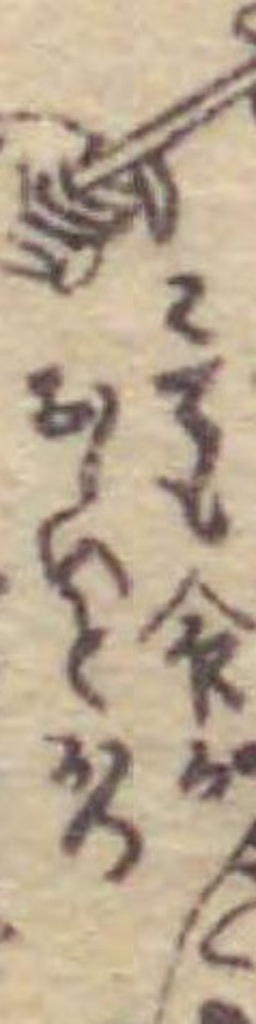おしいとおつ
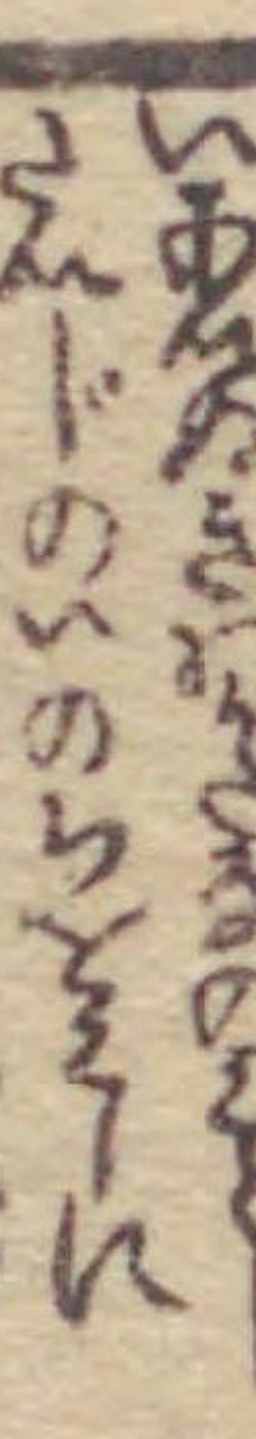たいじのいのちをこしに
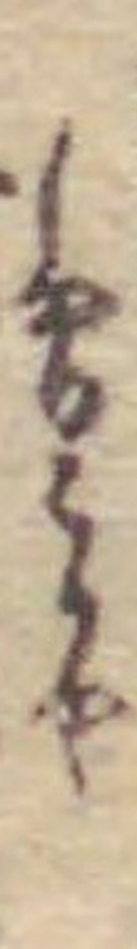しやるこりや
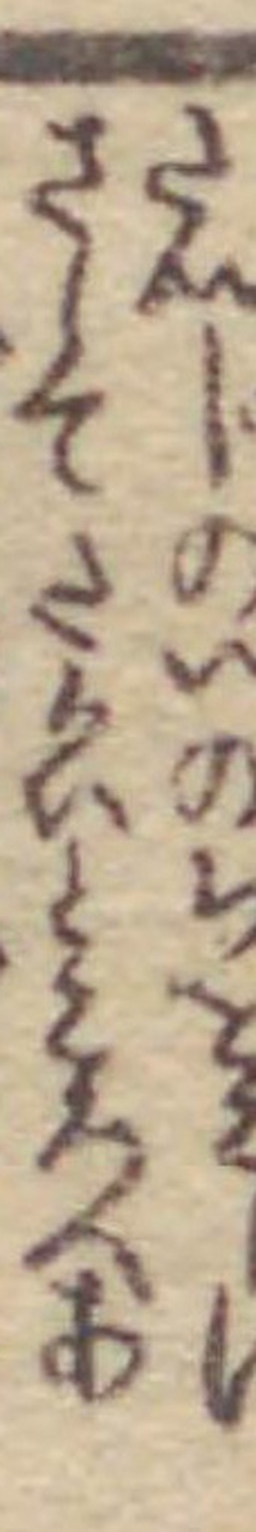さしてたかいところへあ
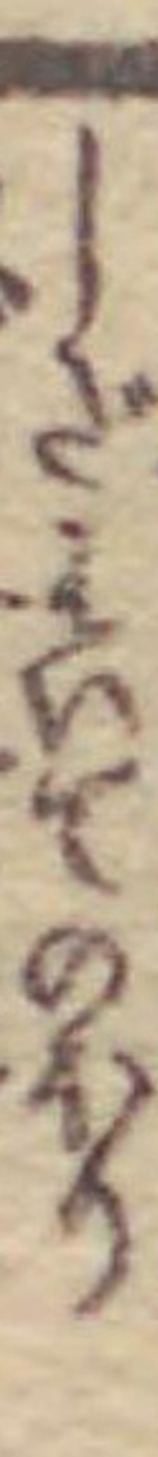しだはいてのほり
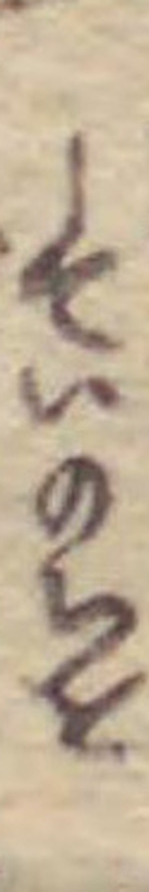していのちを
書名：御誂染長寿小紋 : 3巻
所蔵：国立国会図書館 National Diet Library, JAPAN
